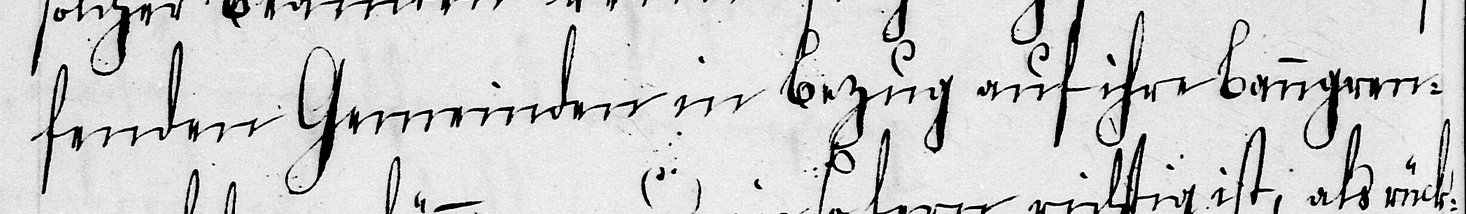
ffenden Gemeinden in Bezug auf ihre Banngren¬
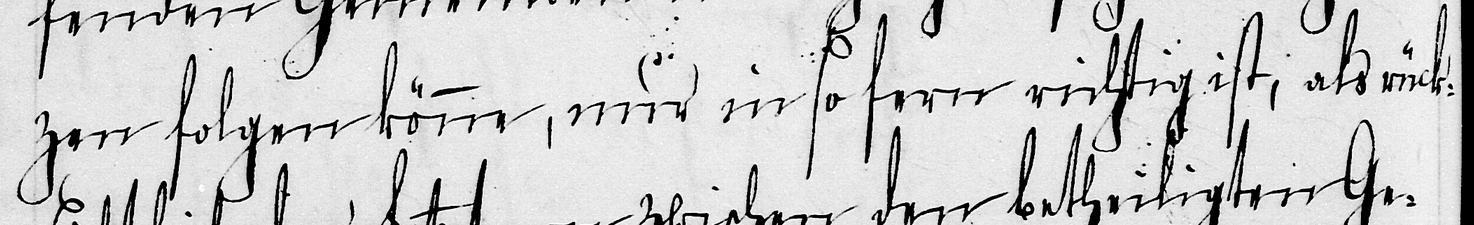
zen folgen könne, nur in so fern richtig ist, als r¬
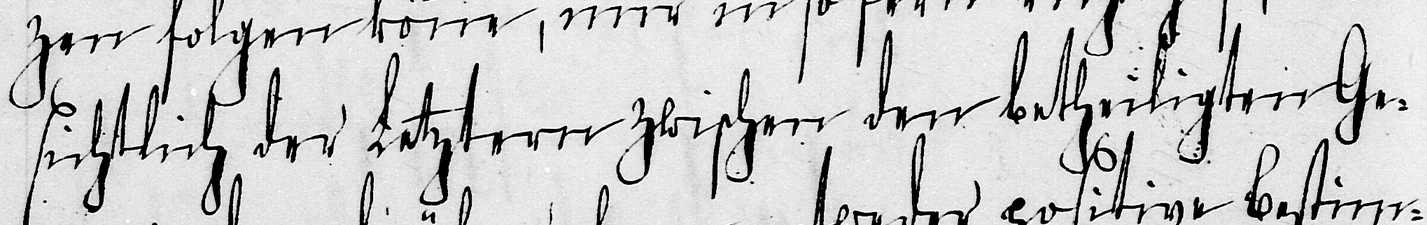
sichtlich der Letztern zwischen den betheiligten Ge¬
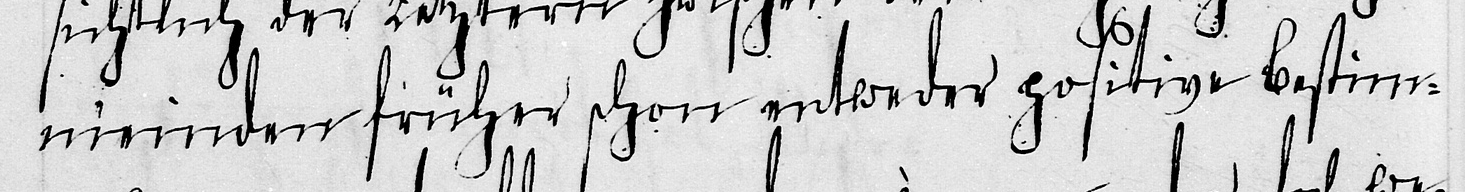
meinden früher schon entweder positive Bestimm¬
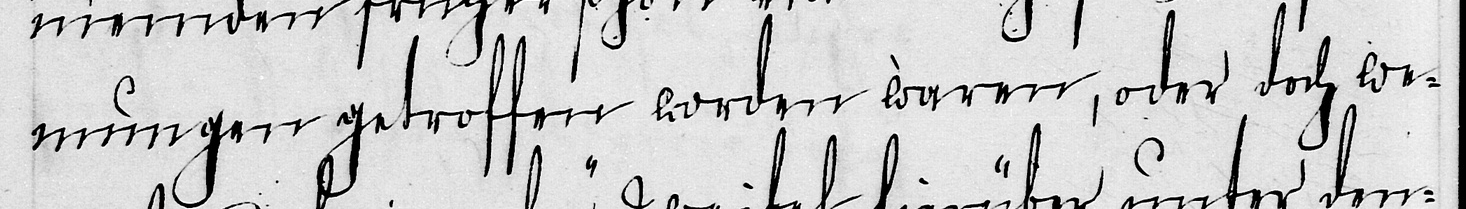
ungen getroffen worden waren, oder doch we¬
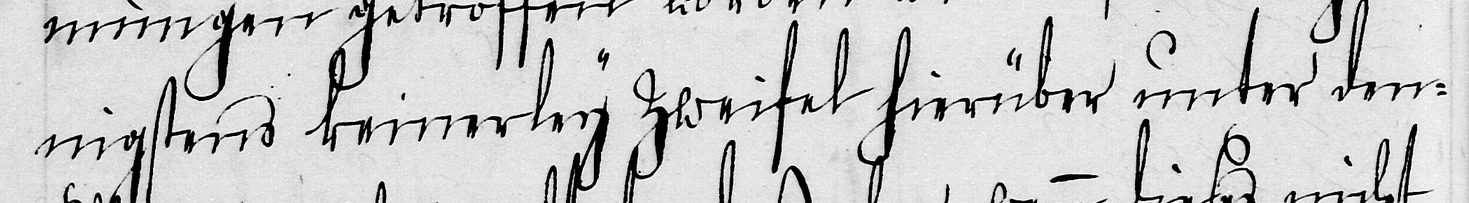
nigstens keinerley Zweifel hierüber unter den¬
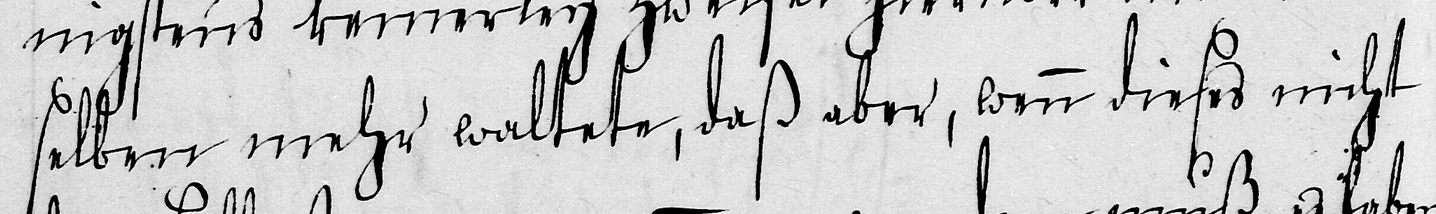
selben mehr waltete, daß aber, wenn dieses nicht
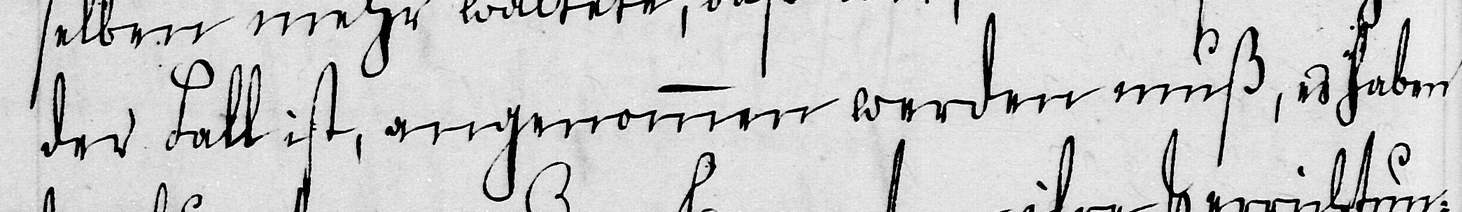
der Fall ist, angenommen werden muß, es haben
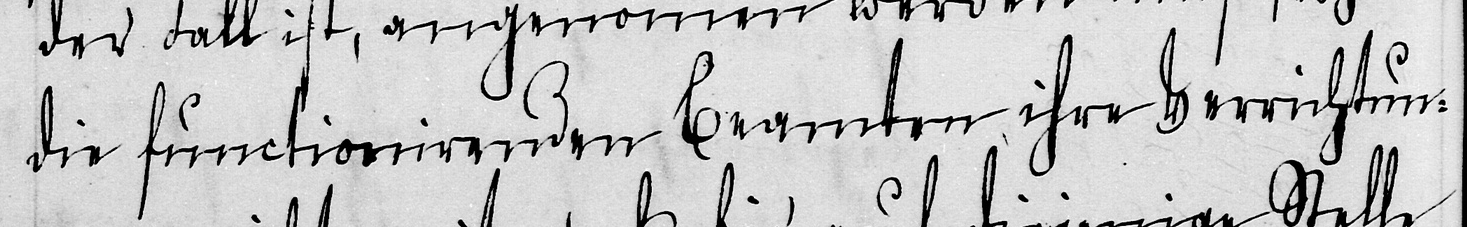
die functionierenden Beamten ihre Verrichtun¬
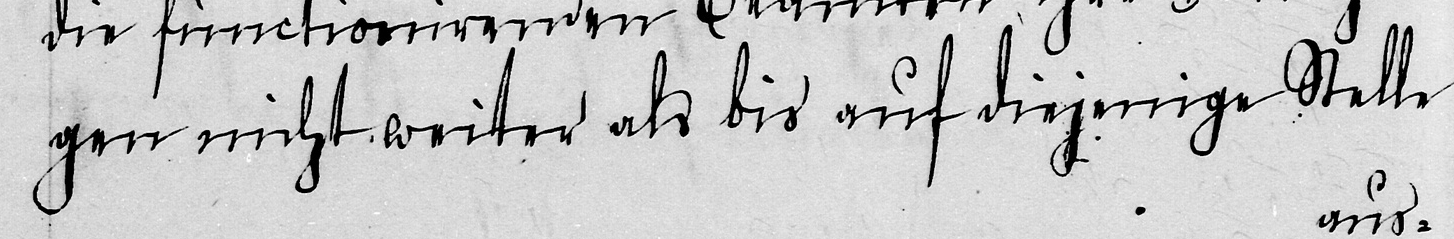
gen nicht weiter als bis auf diejenige Stelle
